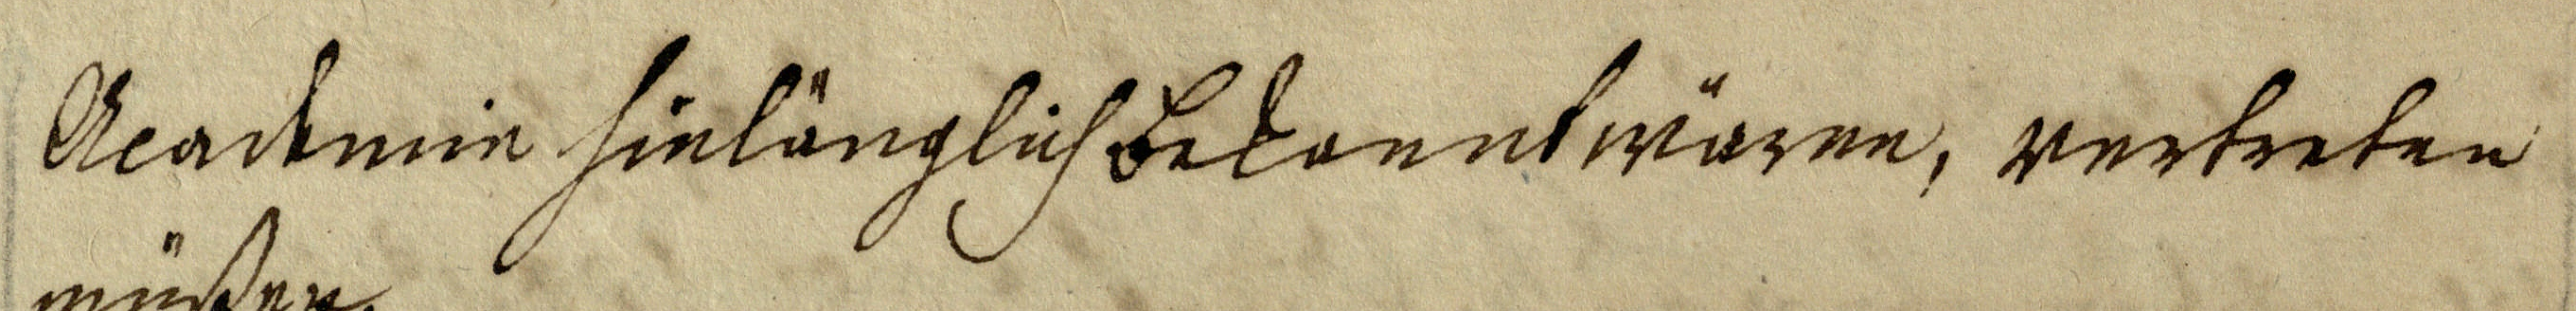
Academie hinlänglich bekannt wären, vertreten
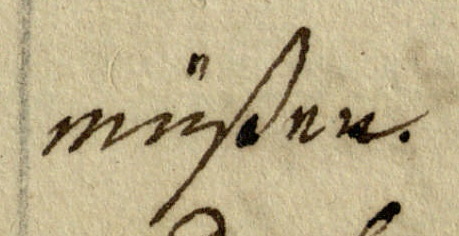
müßen.
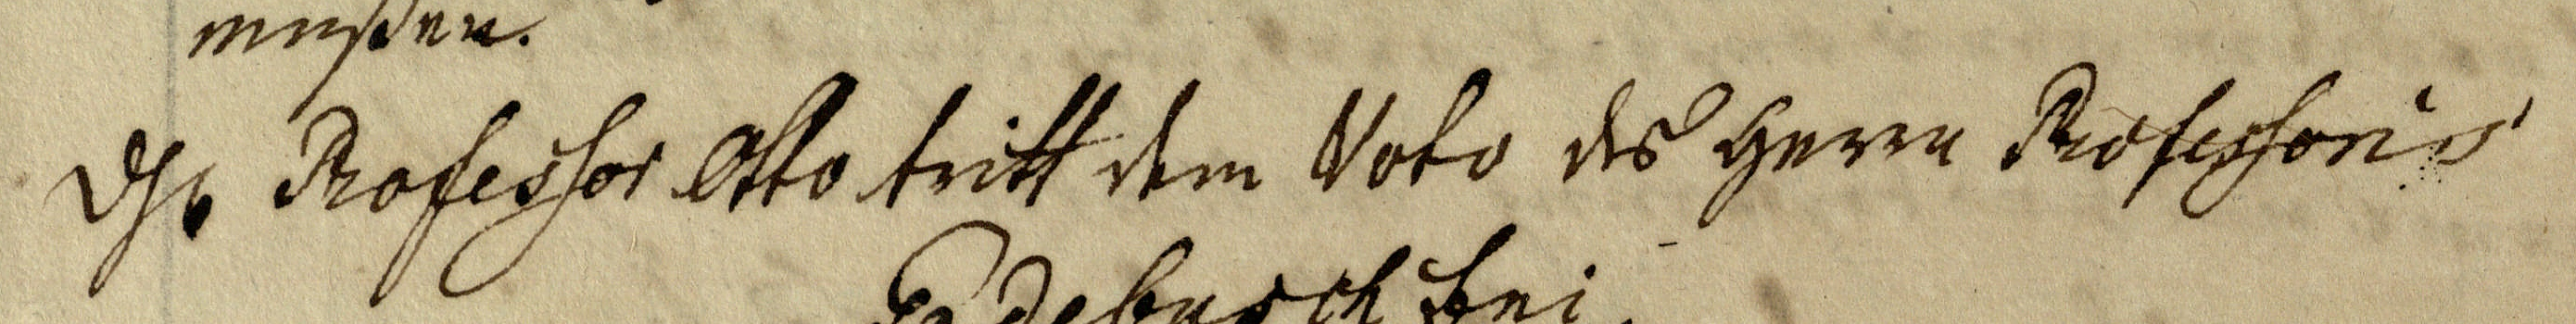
dh Professor Otto tritt dem Voto des Herrn Professoris
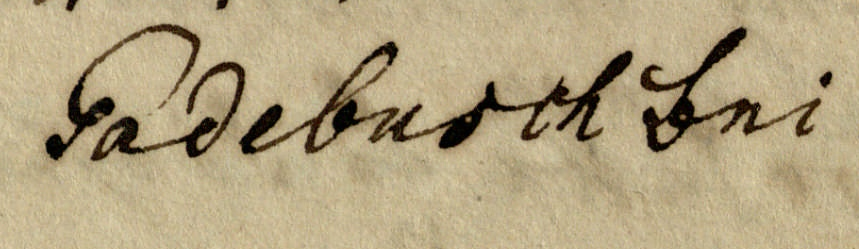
Gadebusch bei.
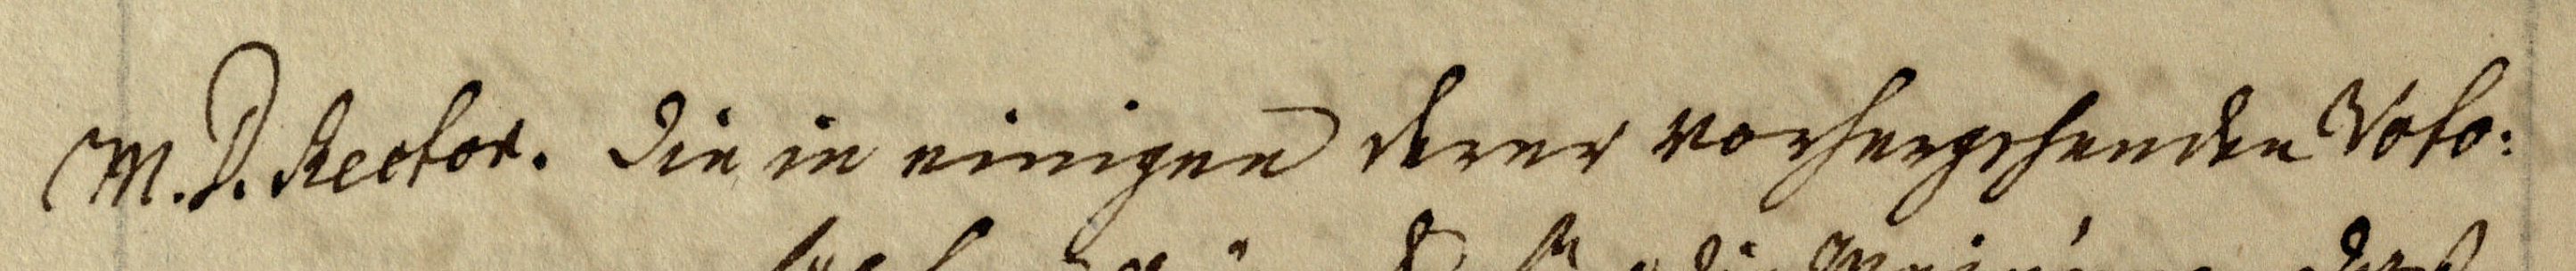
M. D. Rector. Die in einigen derer vorhergehenden Voto¬
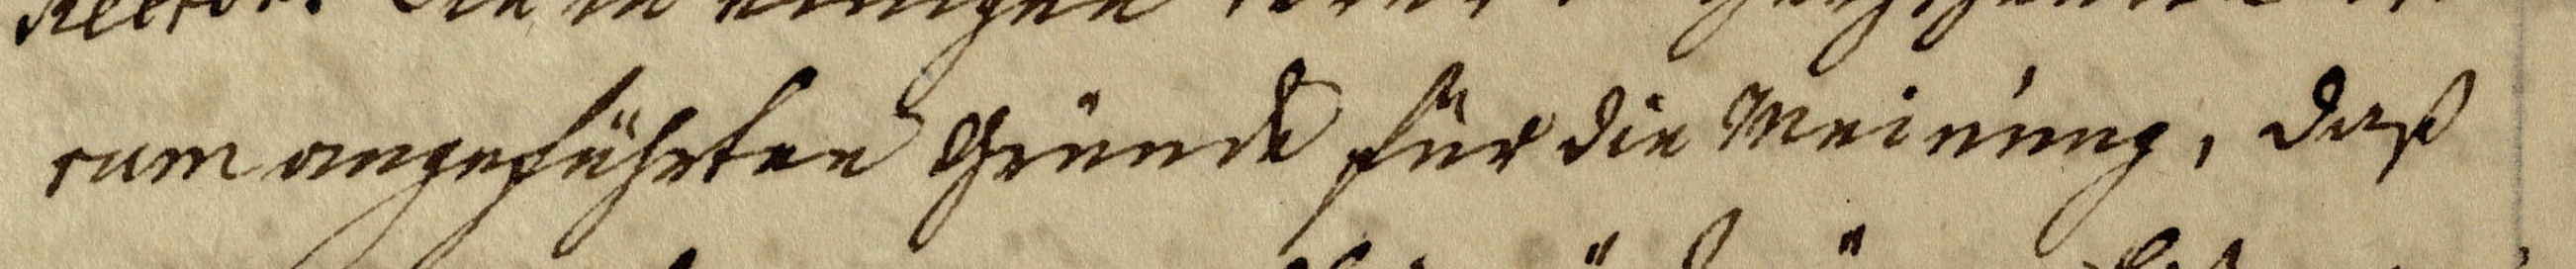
rum angeführten Gründe für die Meinung, daß
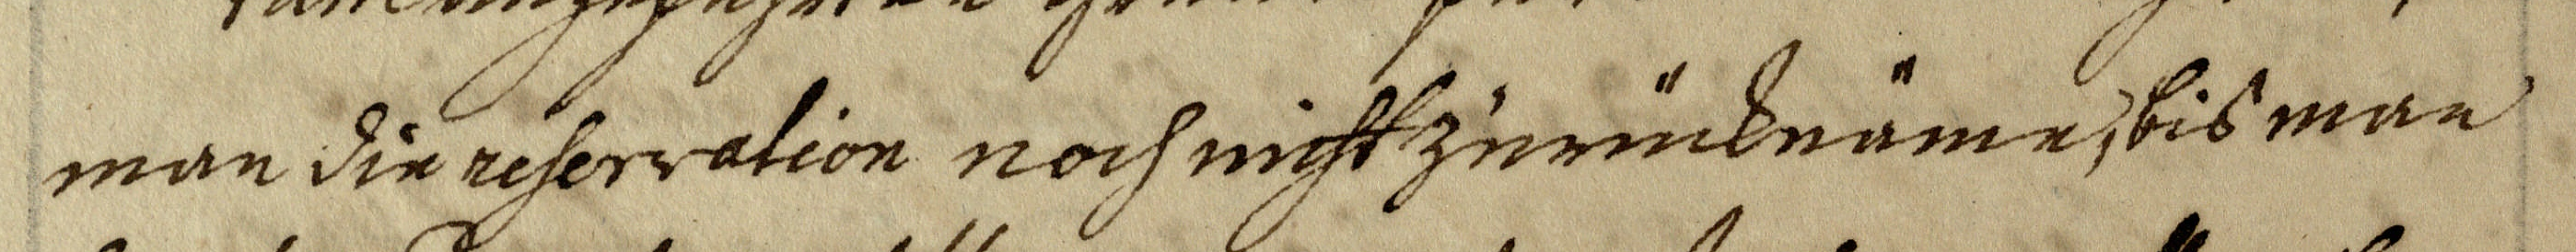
man die reservation noch nicht zurücknäme, bis man
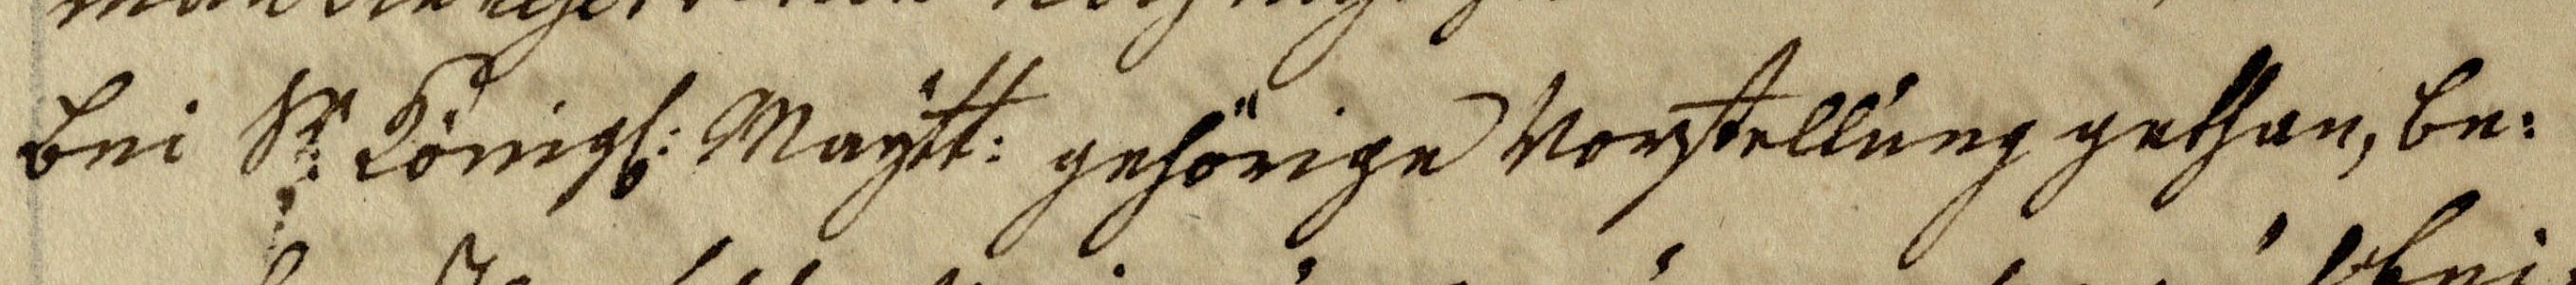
bei Sr. Königl. Maÿtt. gehörige Vorstellung gethan, be¬
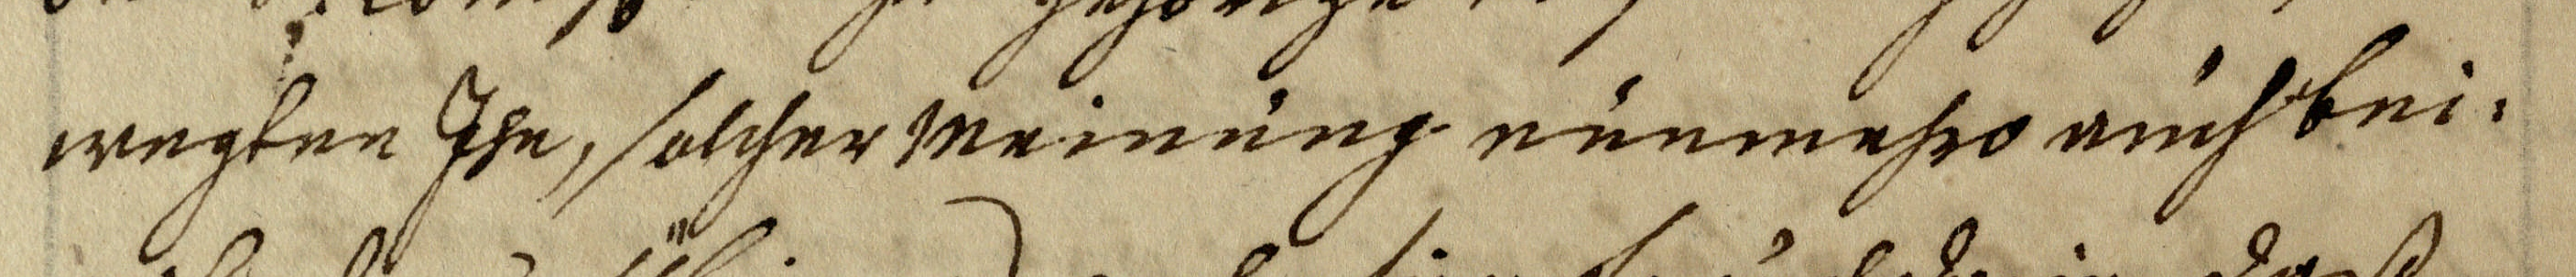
wegten Ihn, solcher Meinung nunmehro auch bei¬
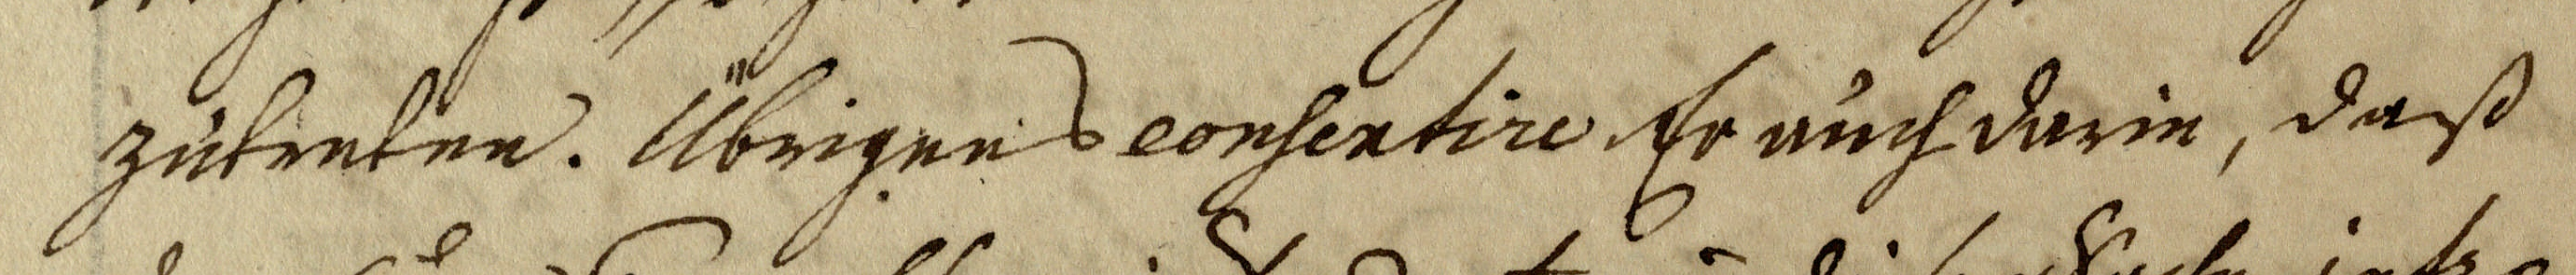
zutreten. Übrigens consentire Er auch darin, daß
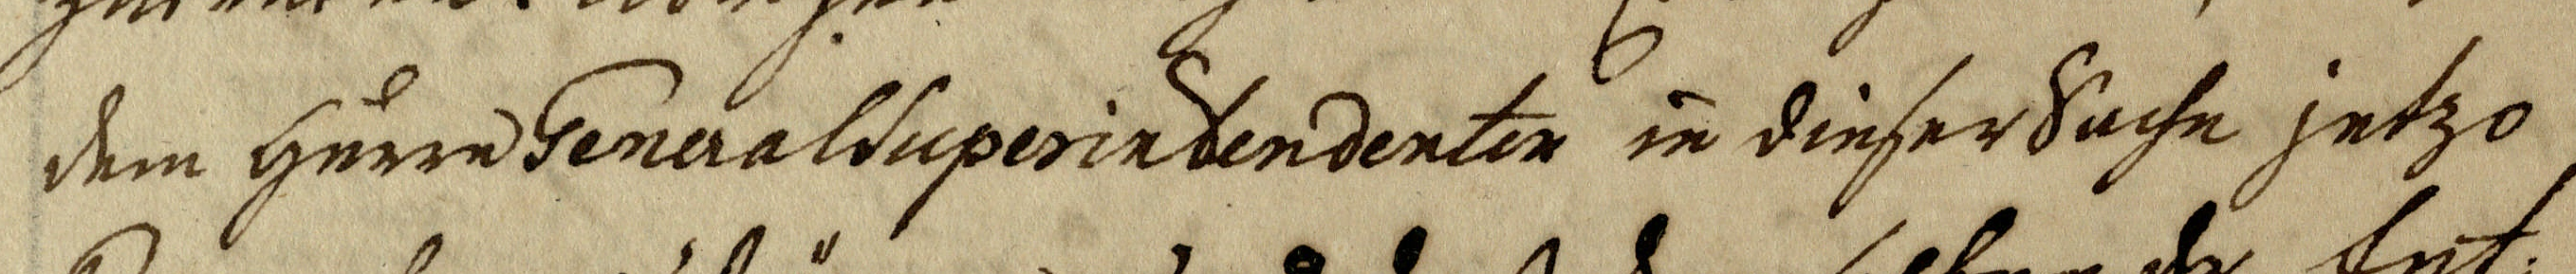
dem Herrn GeneralSuperintendenten in dieser Sache jetzo
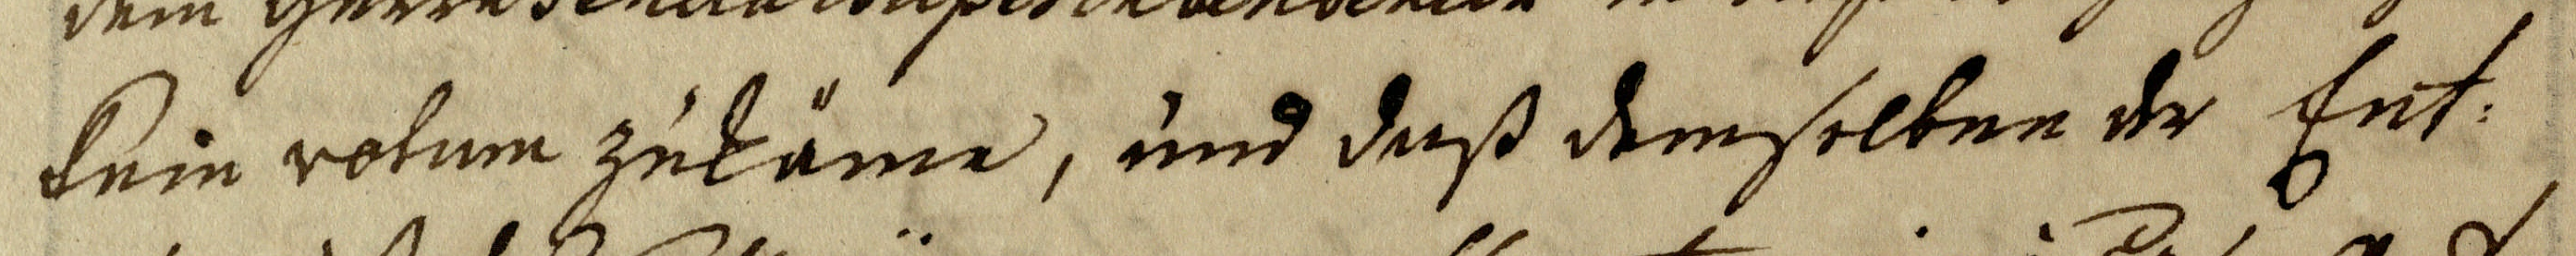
kein votum zukäme, und daß demselben der Ent¬
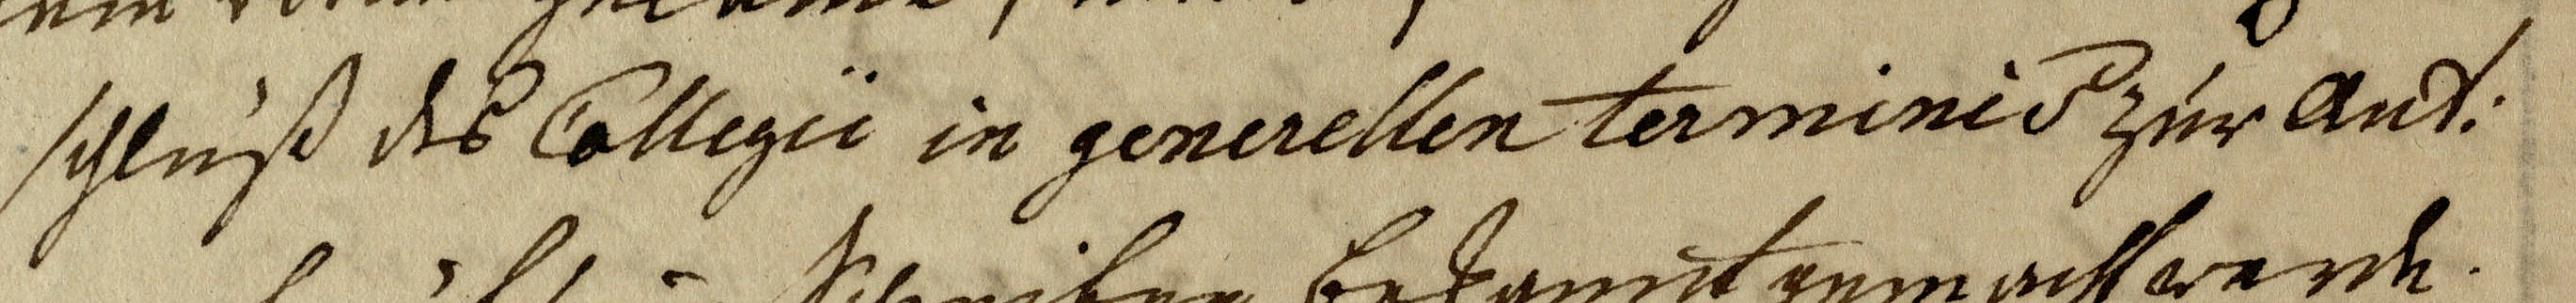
schluß des Collegii in generellen terminis zur Ant¬
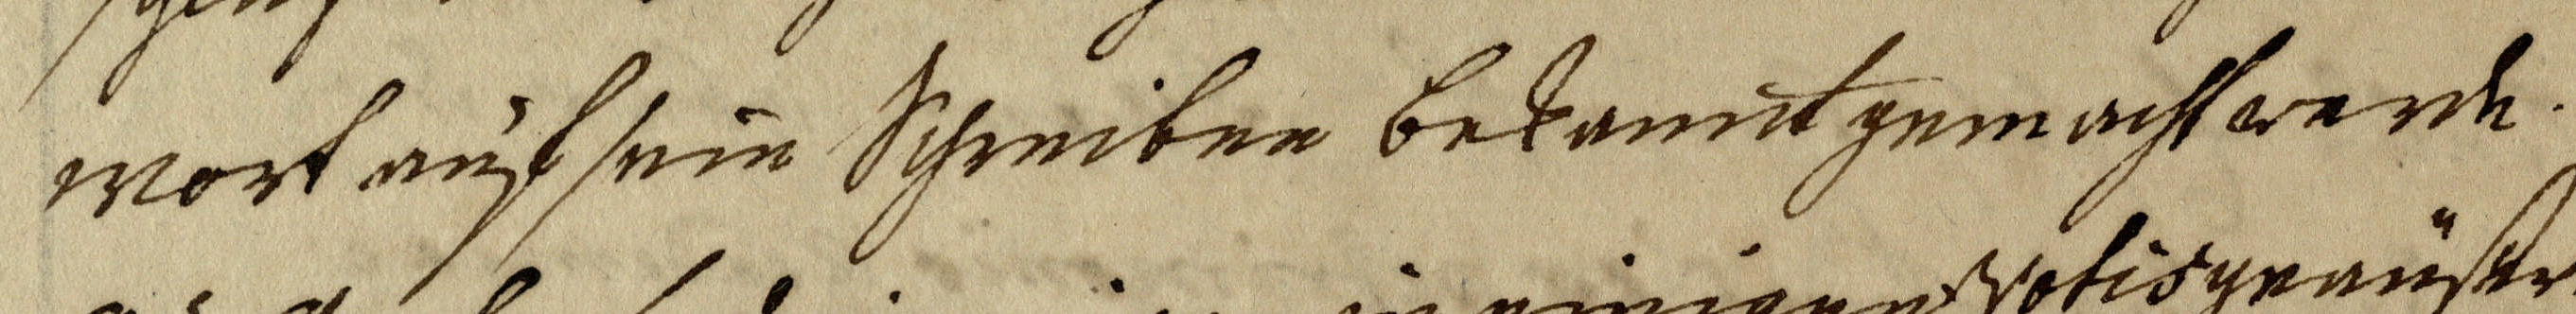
wort auf sein Schreiben bekannt gemacht werde.
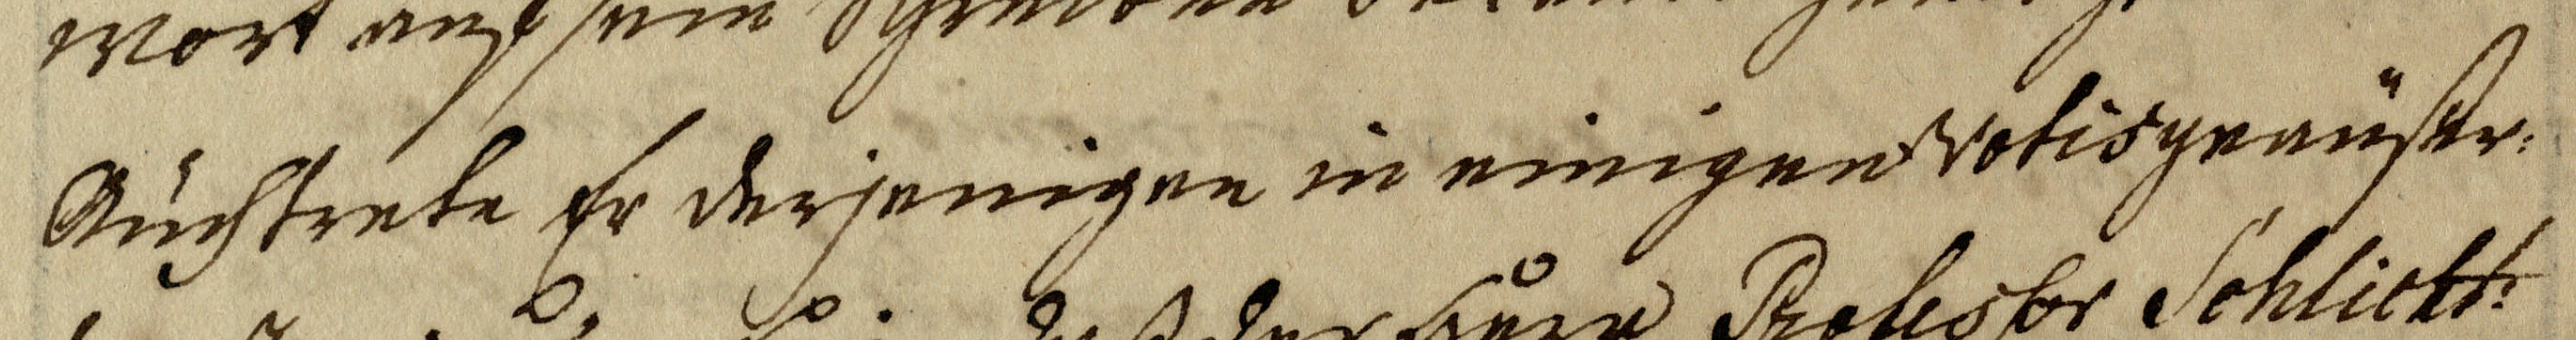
Auch trete Er derjenigen in einigen Votis geäußer¬
